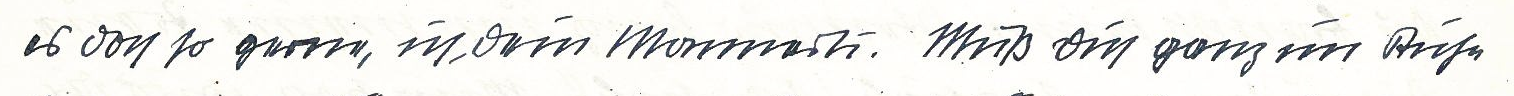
es doch so gerne, ich, Dein Mannerli. Muß Dich ganz in Ruhe
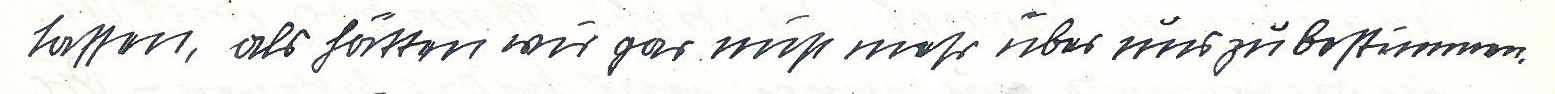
lassen, als hätten wir gar nicht mehr über uns zu bestimmen.
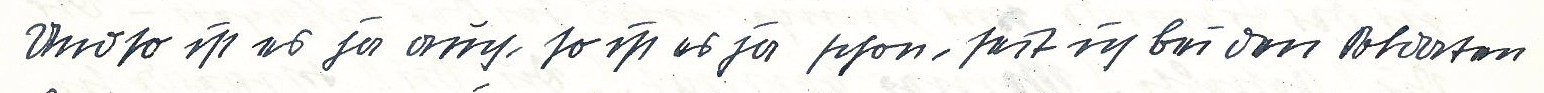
Und so ist es ja auch, so ist es ja schon, seit ich bei den Soldaten
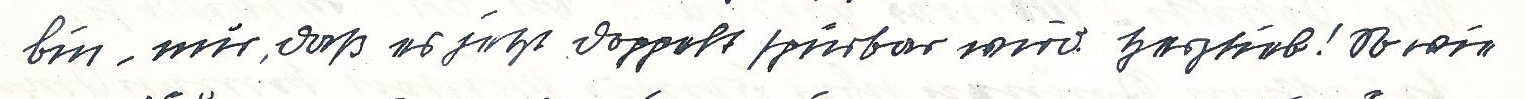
bin, nur, daß es jetzt doppelt spürbar wird. Herzlieb! So wie
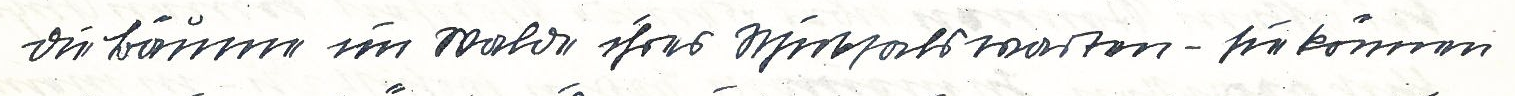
die Bäume im Walde ihres Schicksals warten – sie können
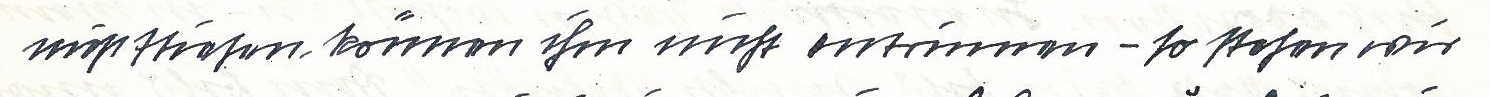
nicht fliehen, können ihm nicht entrinnen – so stehen wir
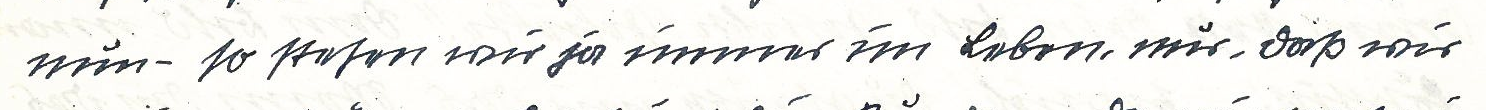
nun – so stehen wir ja immer im Leben, nur, daß wir
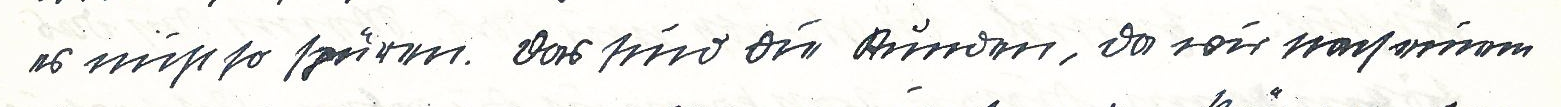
es nicht spüren. Das sind die Stunden, da wir nach einem
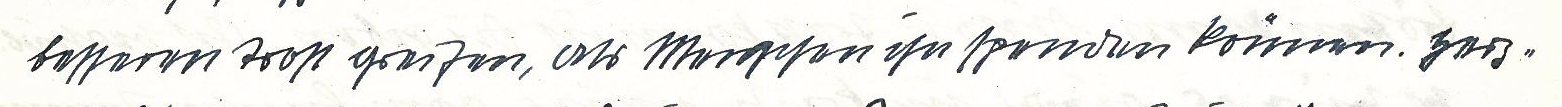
besseren Trost greifen, als Menschen ihn spenden können. Herz¬
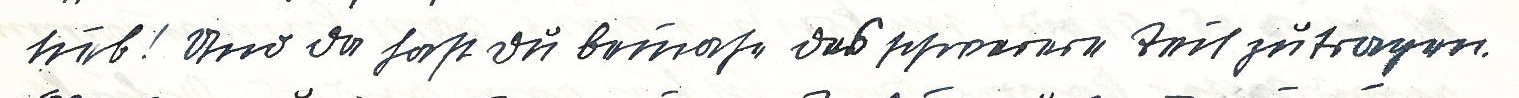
lieb! Und da hast Du beinahe das schwerere Teil zu tragen.
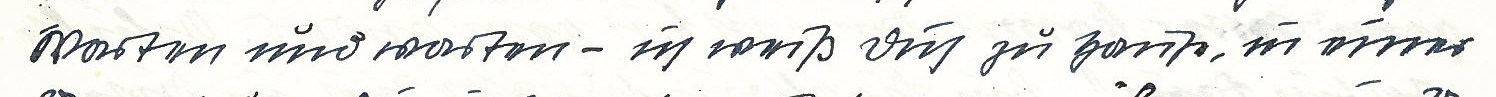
Warten und warten – ich weiß Dich zu Hause, in einer
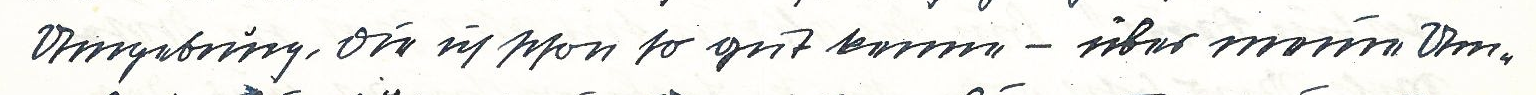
Umgebung, die ich schon so gut kenne – über meine Um¬
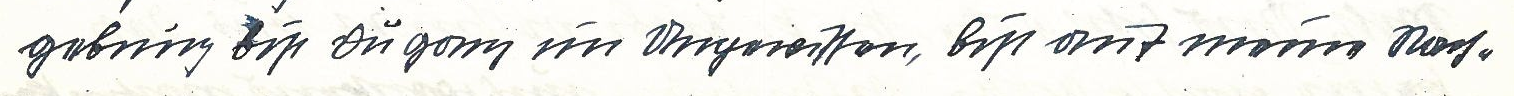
gebung bist Du ganz im Ungewissen, bist auf meine Nach¬
